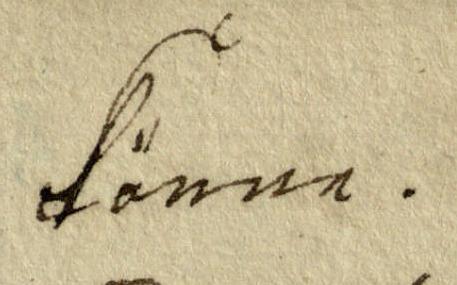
könne.
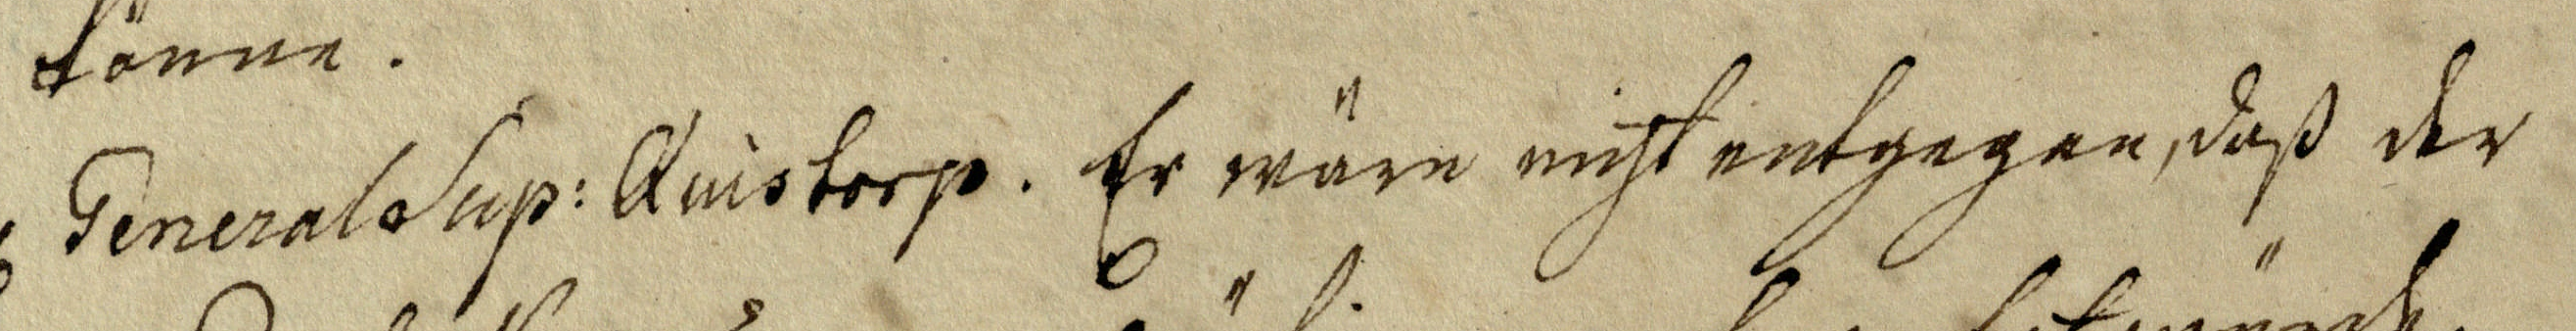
dh General Sup. Quistorp. Er wäre nicht entgegen, daß der
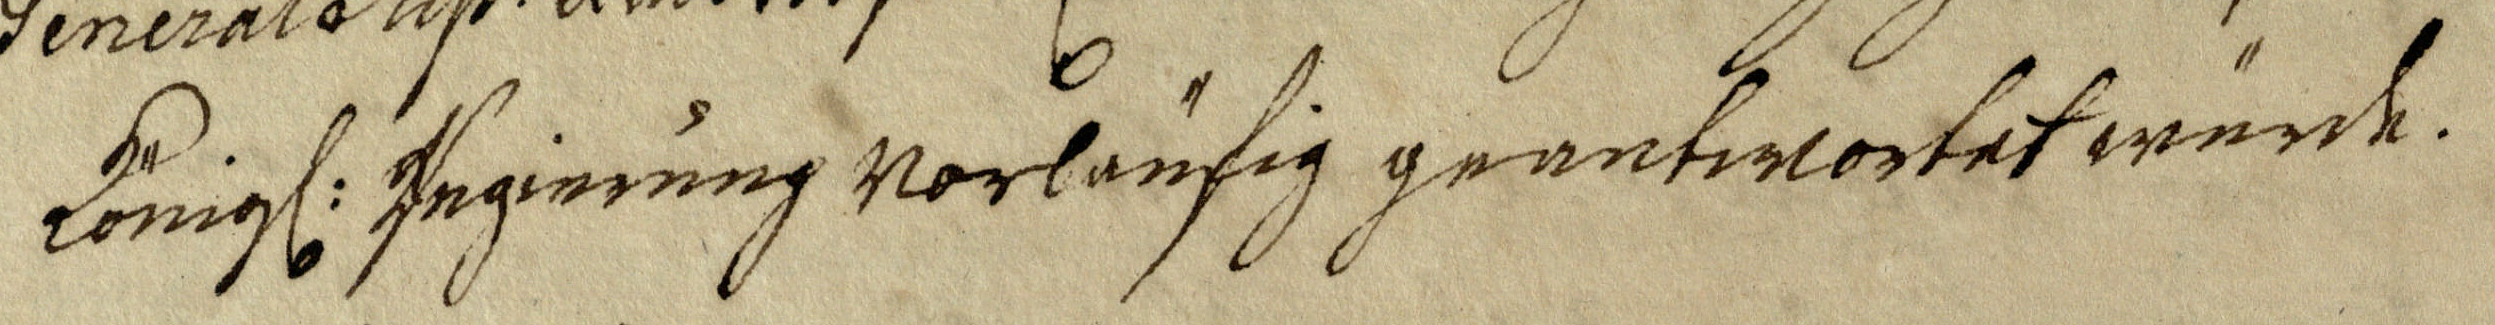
Königl. Regierung vorläufig geantwortet würde.
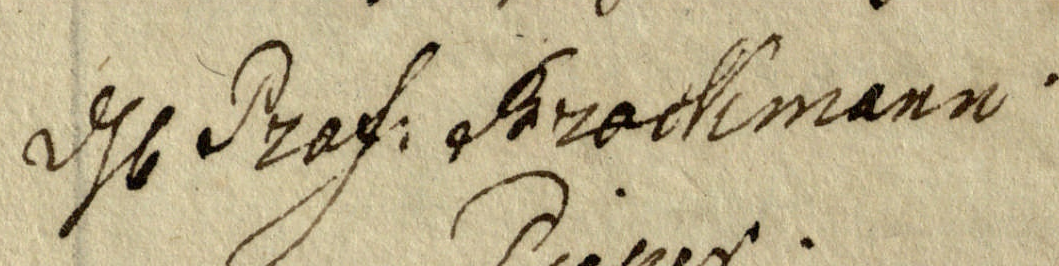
dh Prof. Brockmann
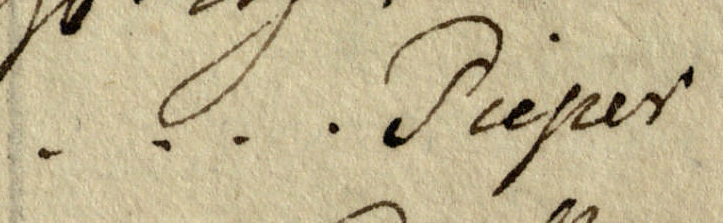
Pieper
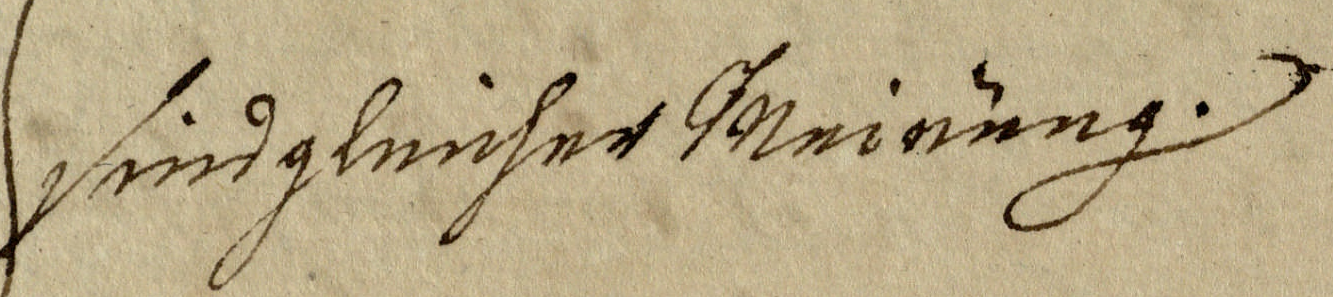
sind gleicher Meinung.
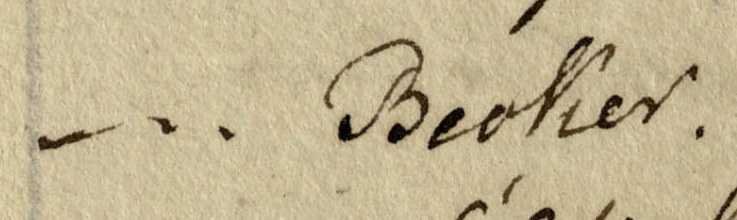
Becker.
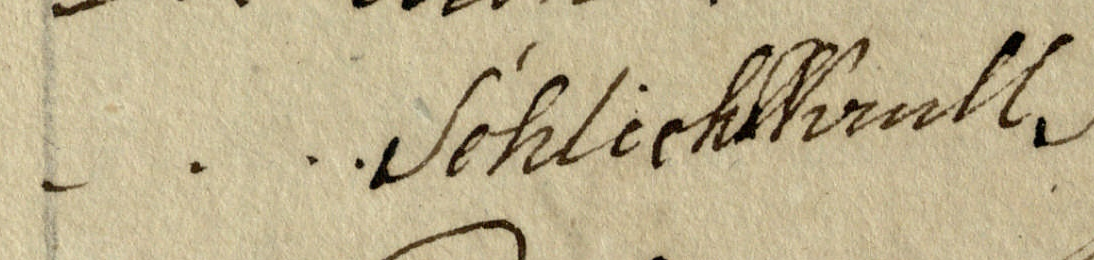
Schlichtkrull
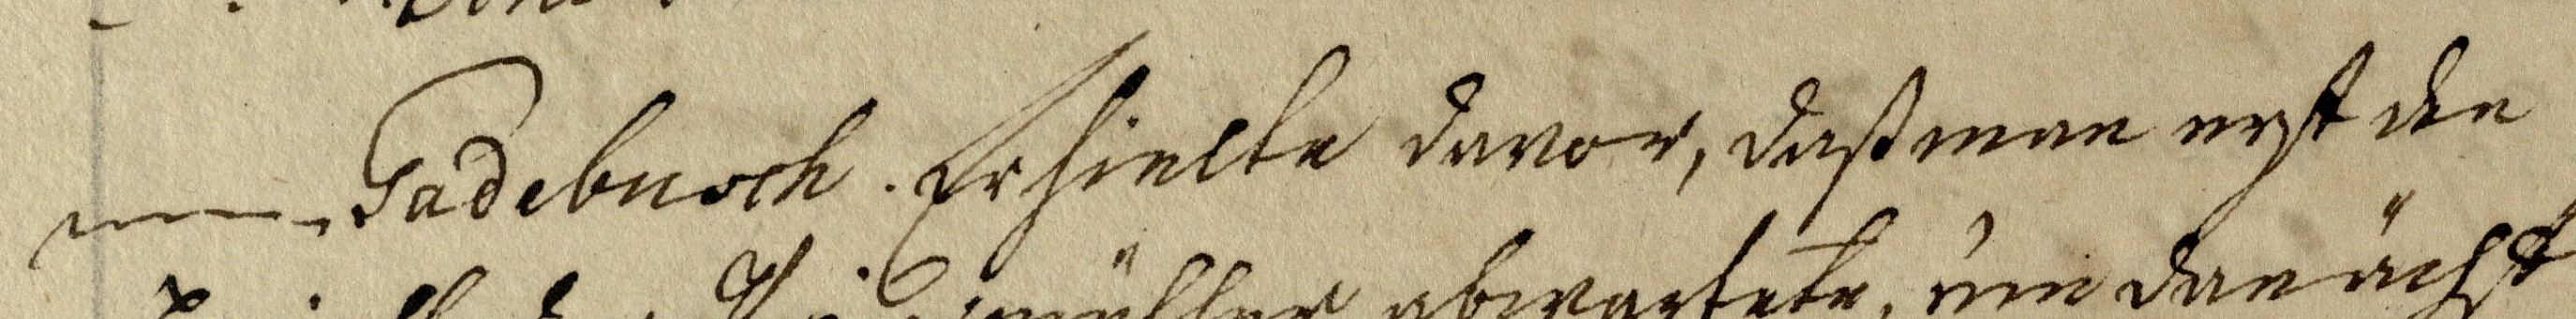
Gadebusch Er hielte davor, das man erst den
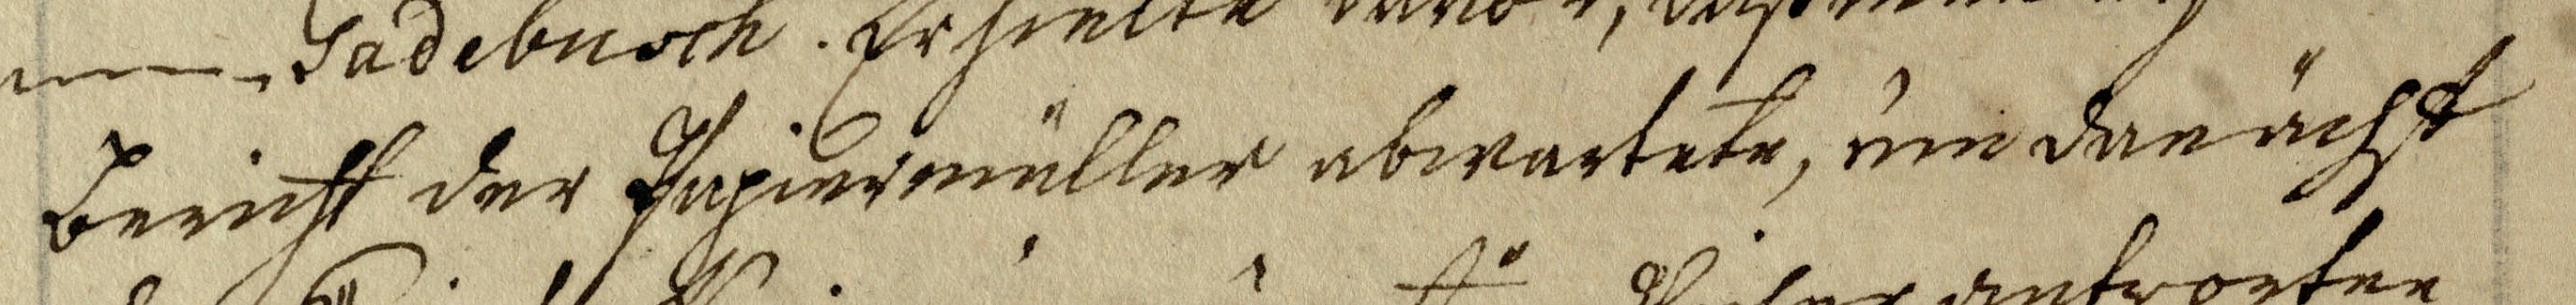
Bericht der Papiermüller abwartete, um danächst
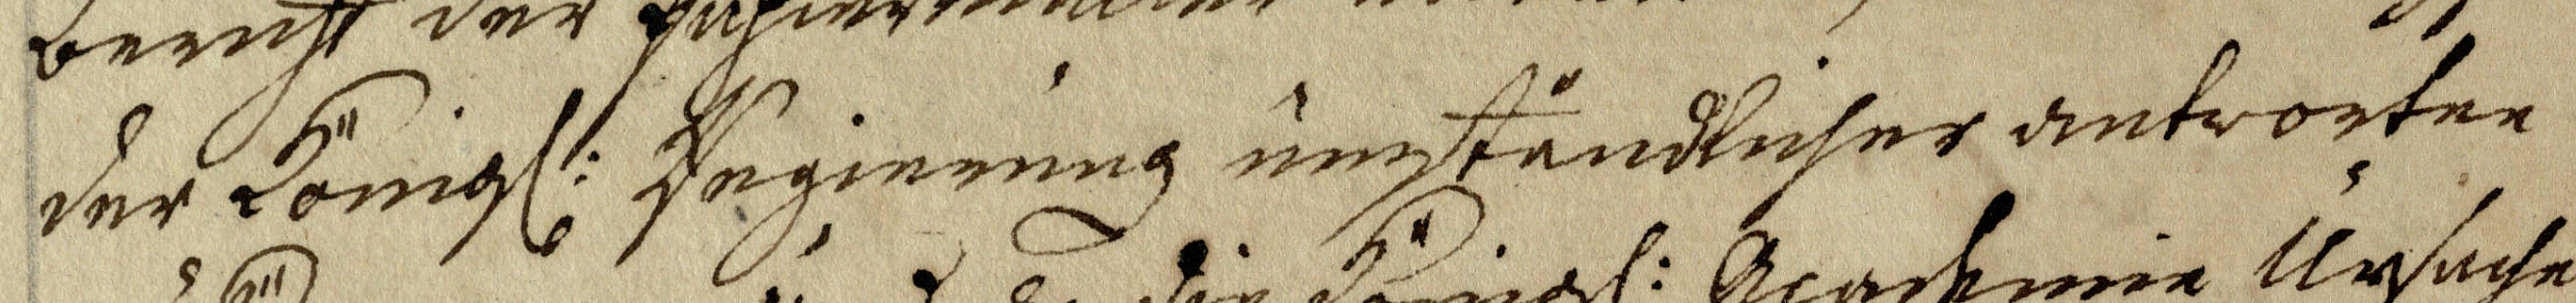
der Königl. Regierung umständlicher antworten
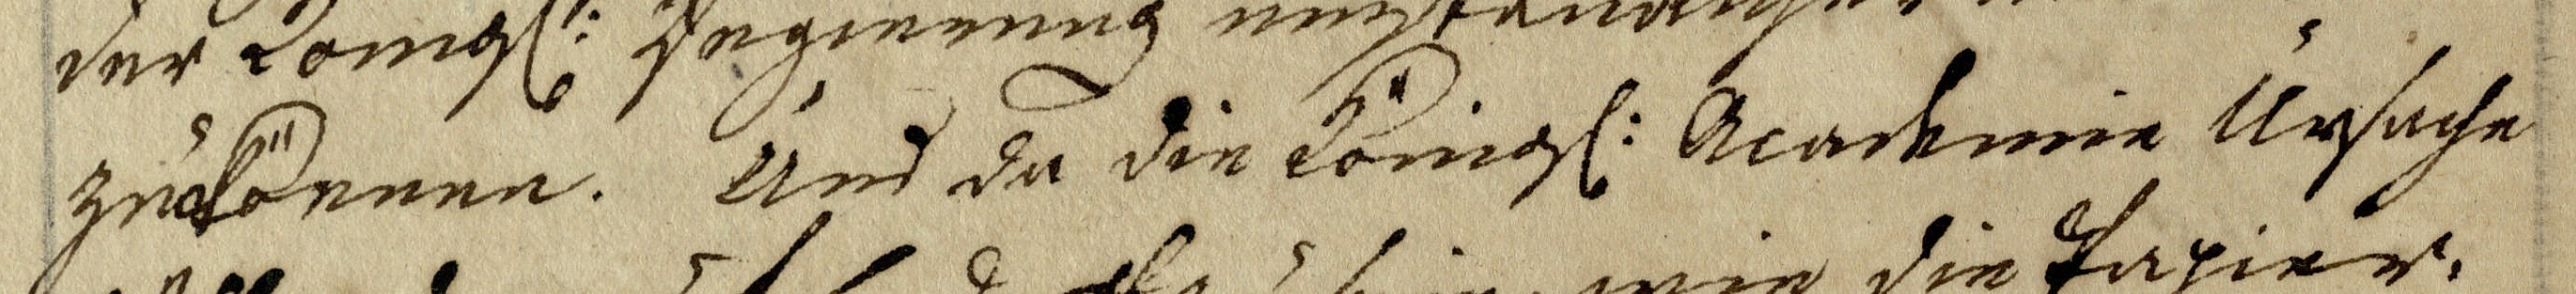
zu können. Und Da die Königl. Academie Ursache
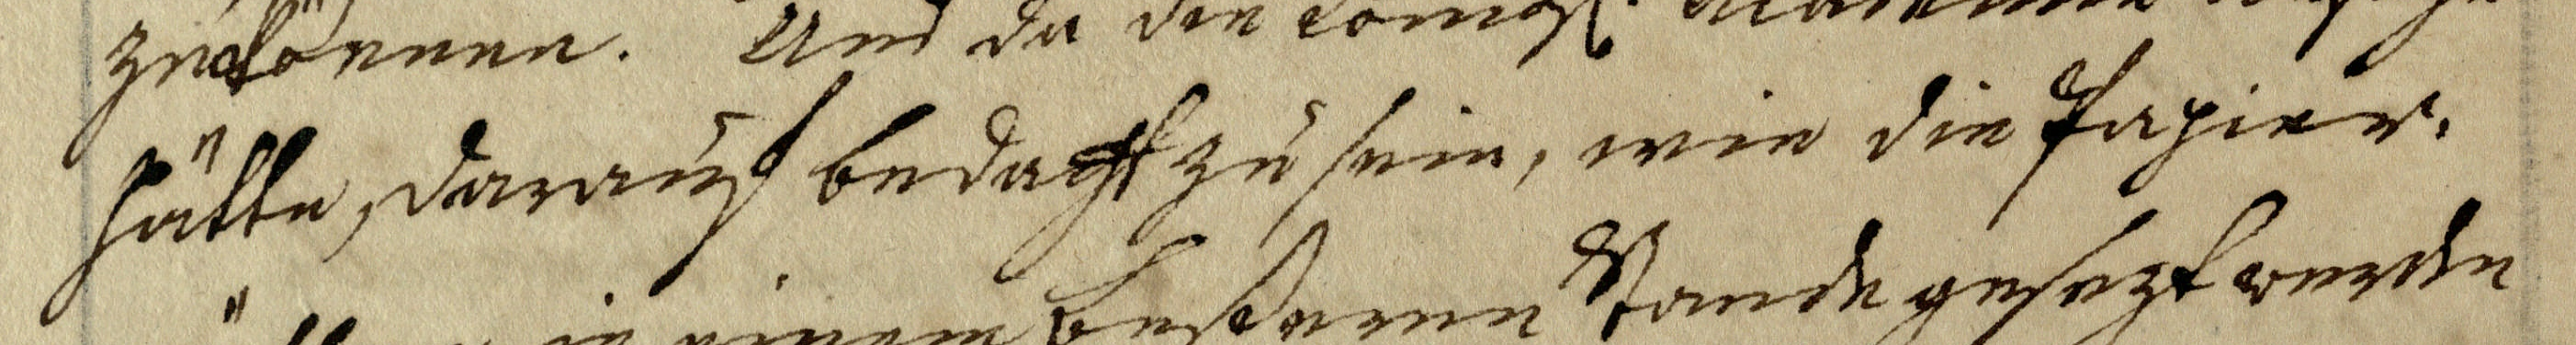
hätte, darauf bedacht zu sein, wie die Papier¬
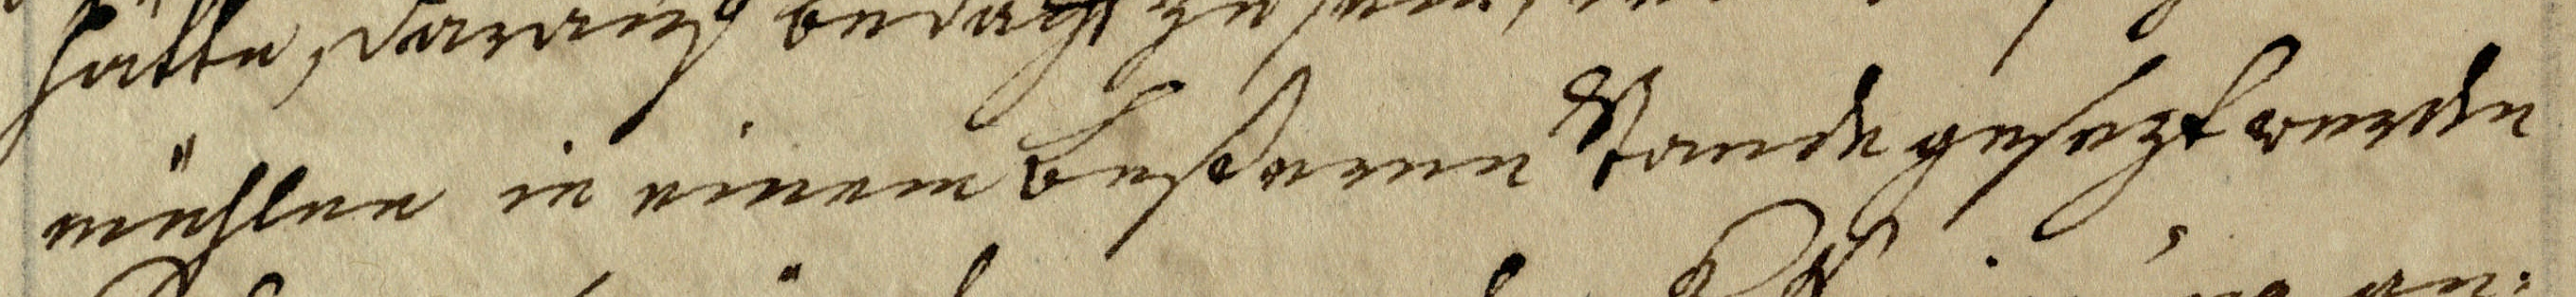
mühlen in einem beßeren Stande gesezt werden
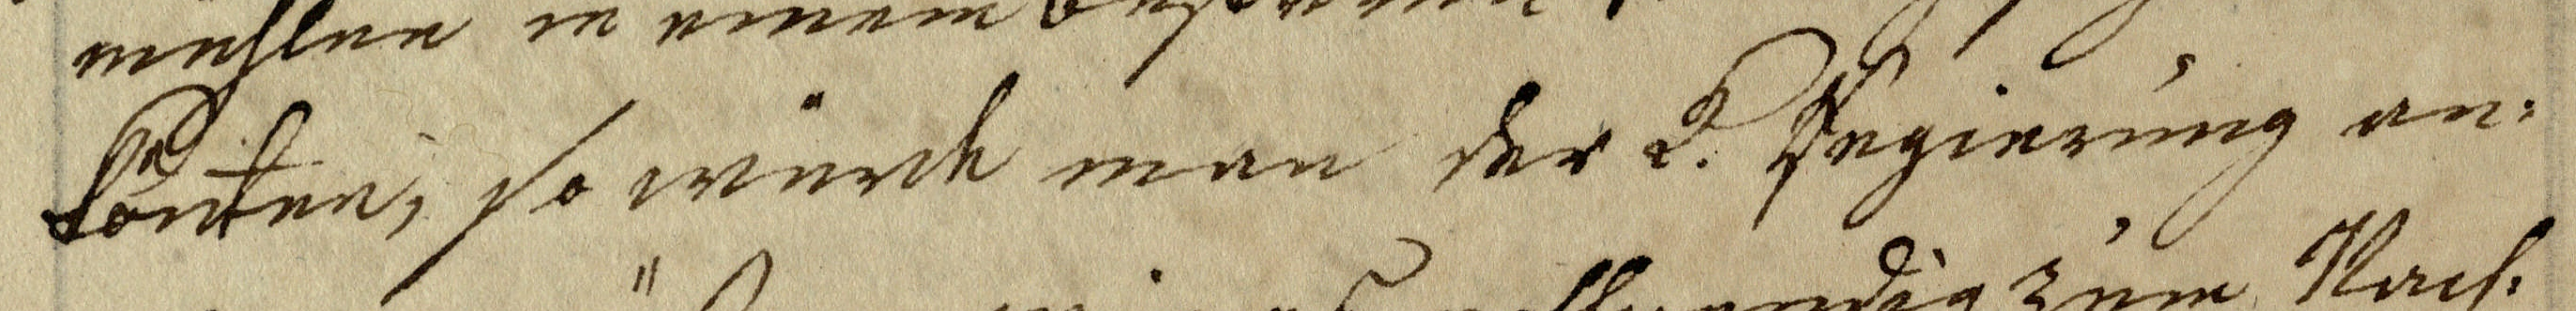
könten, so würde man der K. Regierung an¬
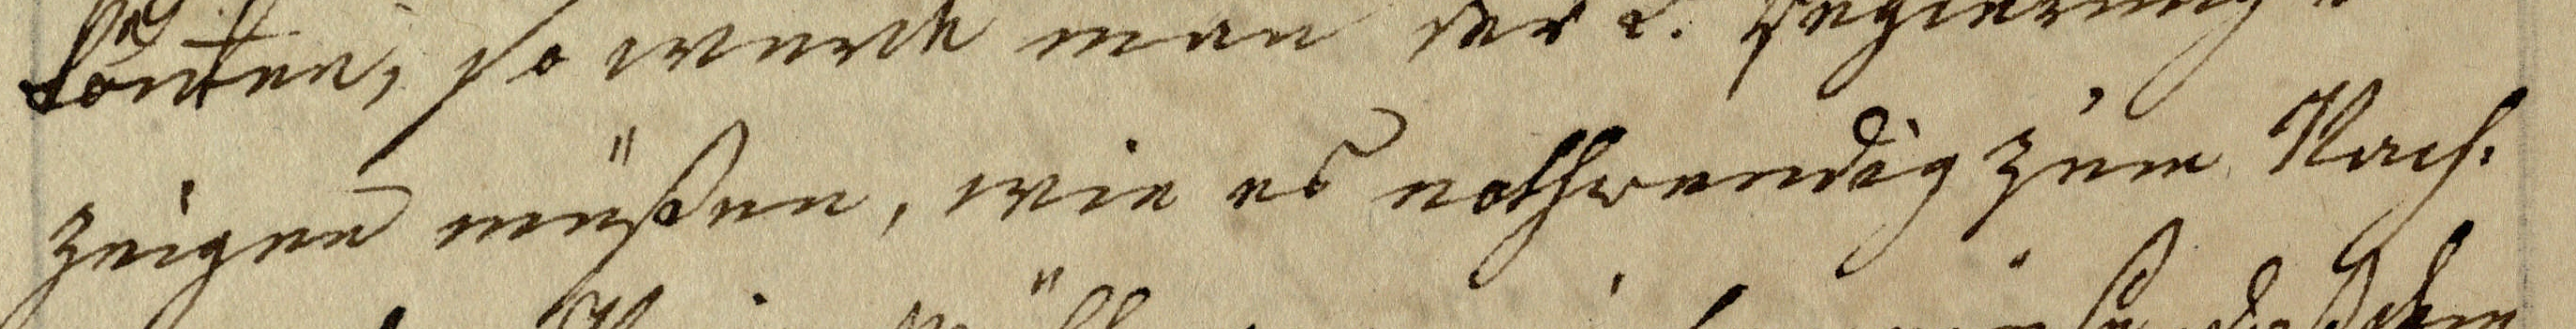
zeigen müßen, wie es nothwendig zum Nach¬
